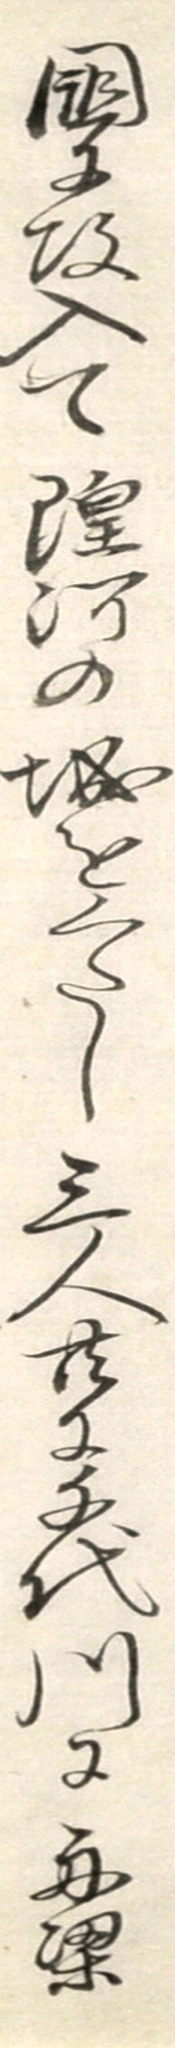国に攻入て隍河の城をくたし三人共に千代川に舟梁
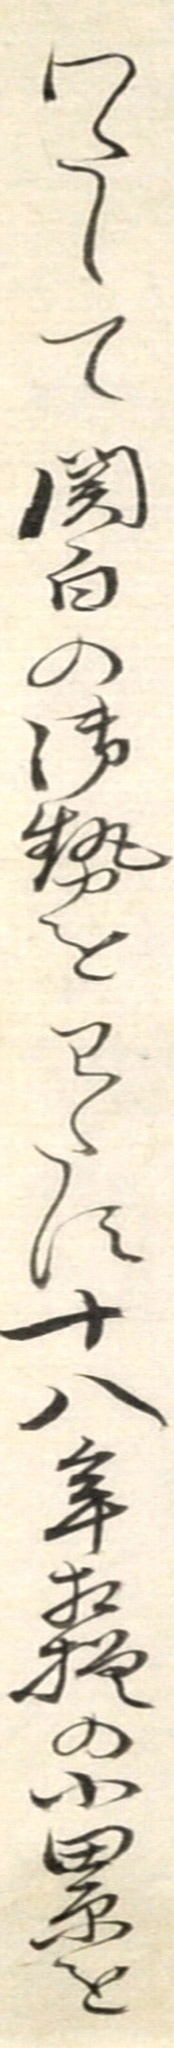わたして関白の御勢をわたす十八年相模の小田原を
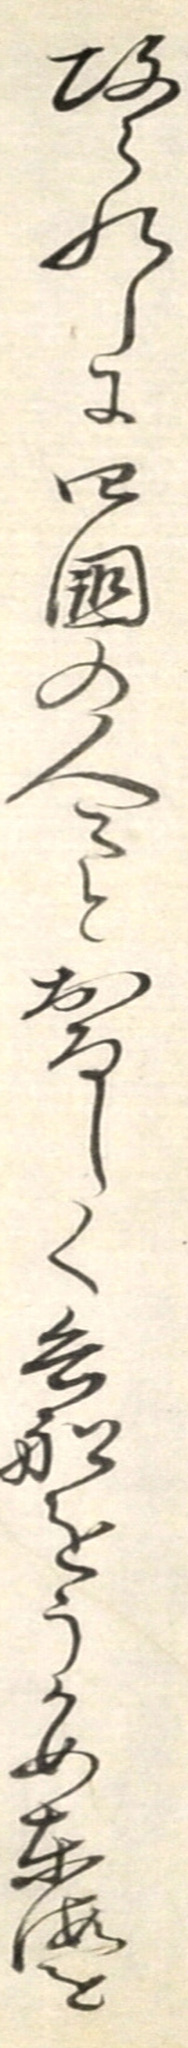攻られしに四国の人々とおなしく兵船をうかめ東海を
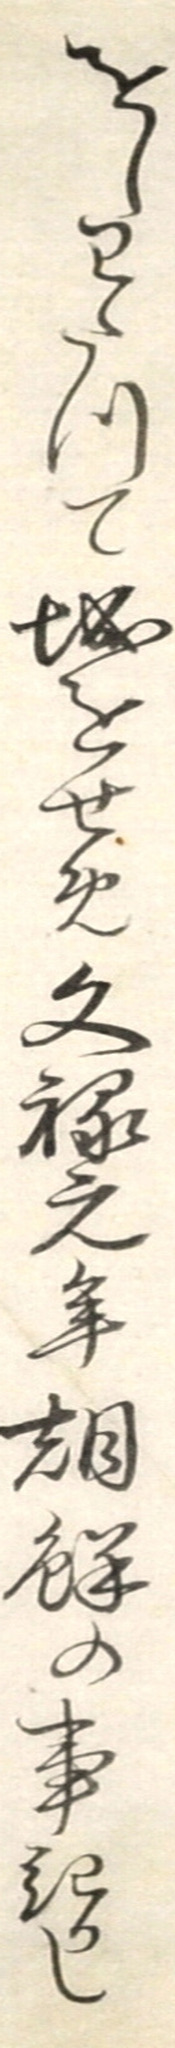をしわたつて城をせめ文禄元年朝鮮の事起りし
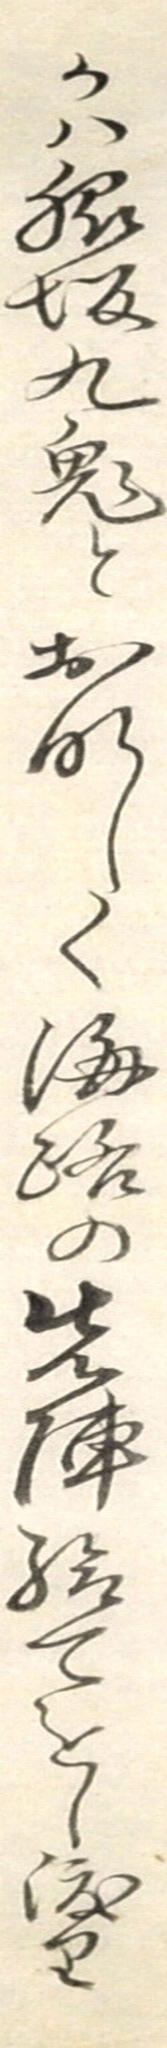かは脇坂九鬼とおなしく海路の先陣給てをし渡り
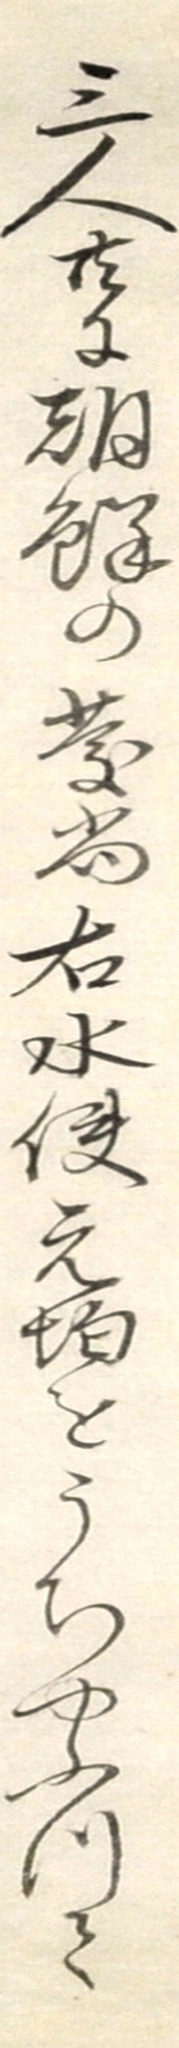三人共に朝鮮の慶尚右水使元均をうちやふつて
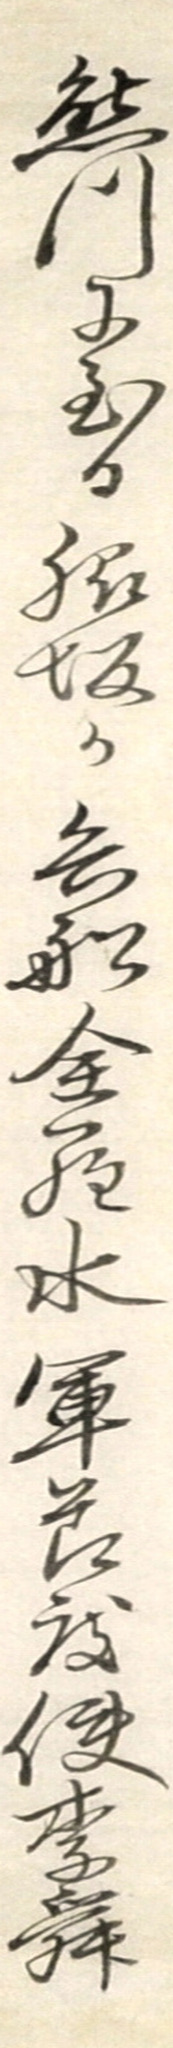熊川に至る脇坂か兵船全羅水軍節度使李舜
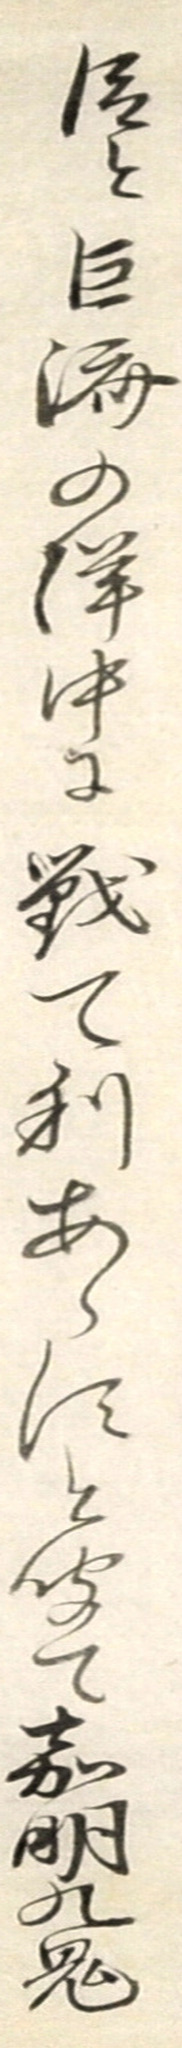臣と巨済の洋中に戦て利あらすと聞て嘉明九鬼
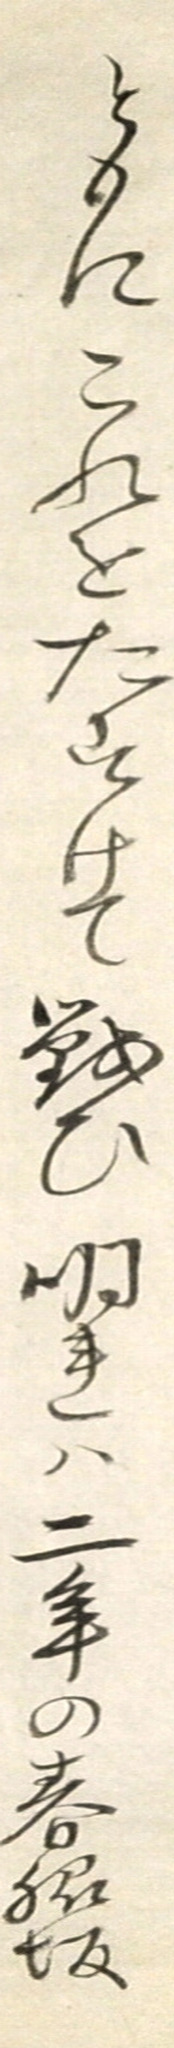ともにこれをたすけて戦ひ明れは二年の春脇坂
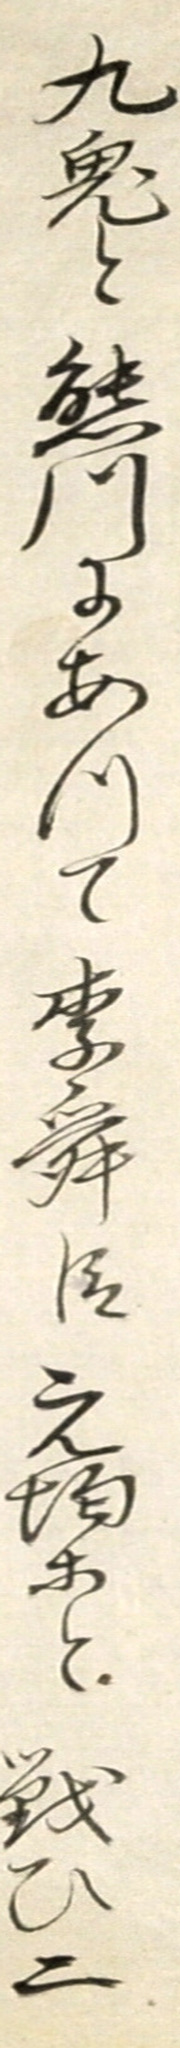九鬼と熊川にあつて李舜臣元均等と戦ひ二
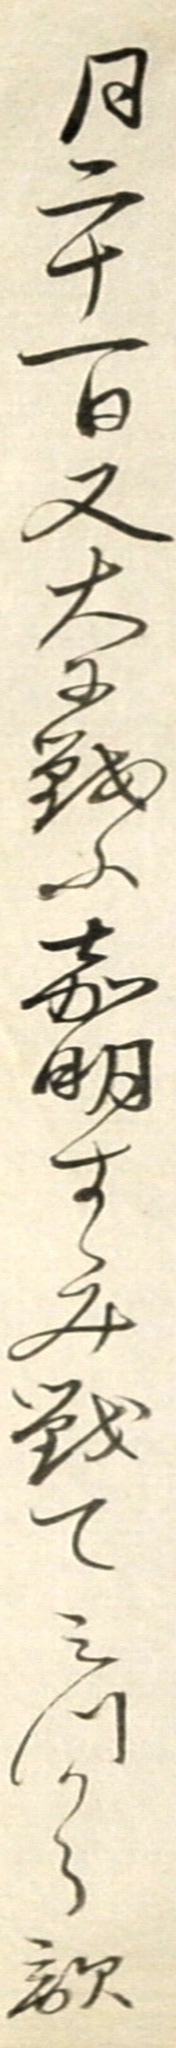月二十一日又大に戦ふ嘉明すゝみ戦てみつから敵
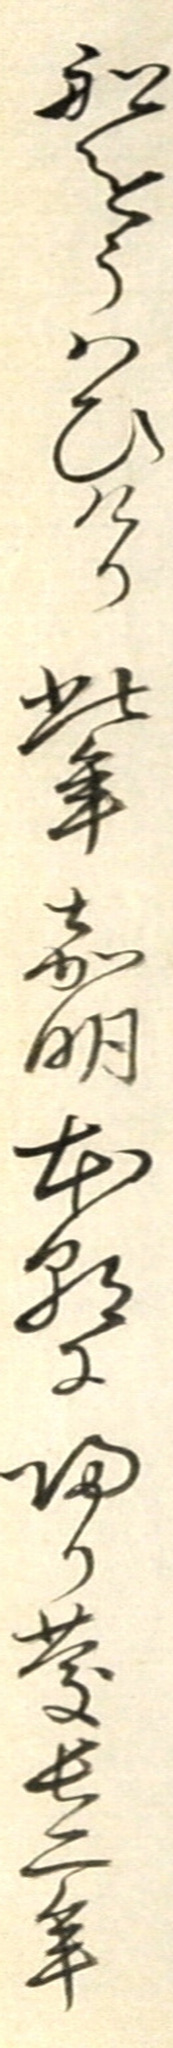船をうはひけり此年嘉明本朝に帰り慶長二年

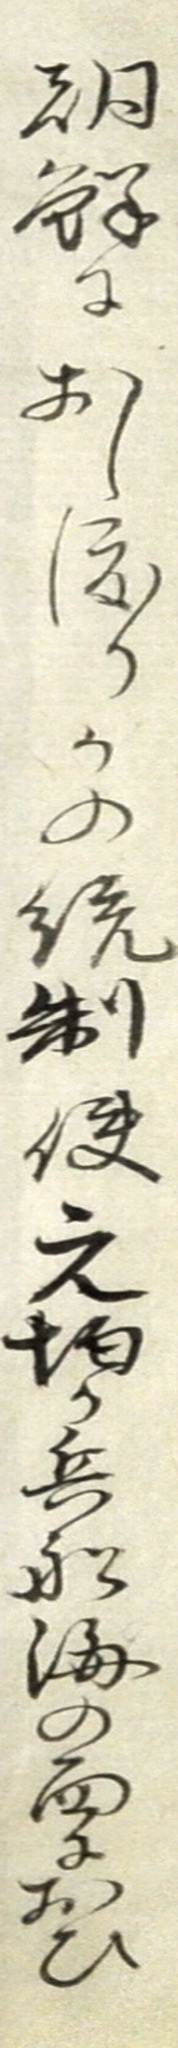朝鮮におし渡りかの統制使元均か兵船海の面におひ
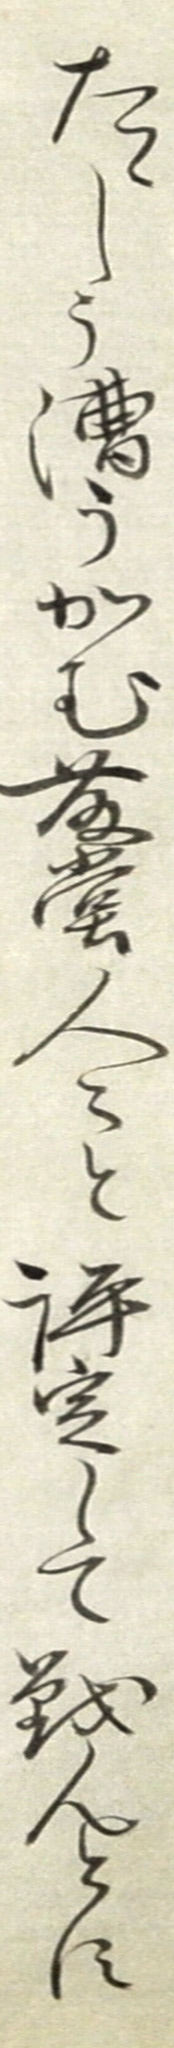たゝしう漕うかむ藤堂人々と評定して戦んとす
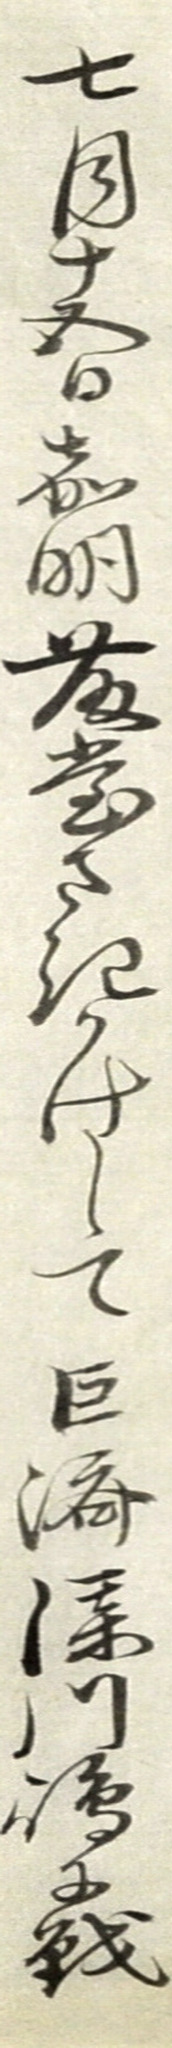七月十五日嘉明藤堂さきかけして巨済漆川島に戦
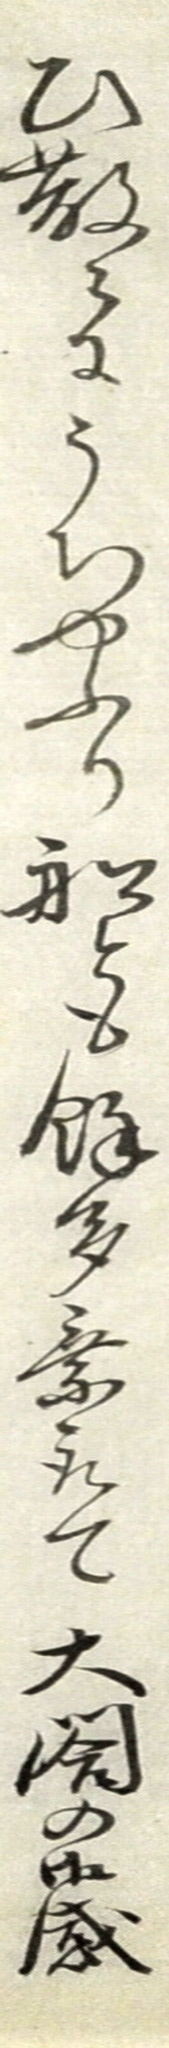ひ散々にうちやふり船とも余多乗取て太閤の御感
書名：藩翰譜（七・下）
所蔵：伊那市立高遠町図書館・合同会社AMANE
